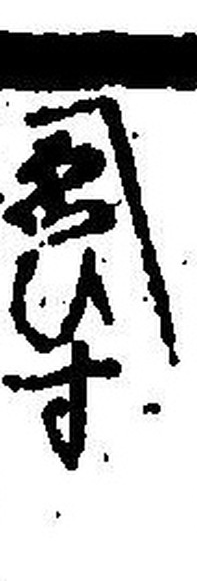〽ゑひす
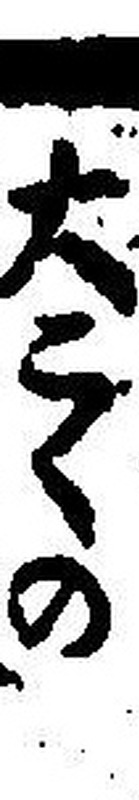大こくの
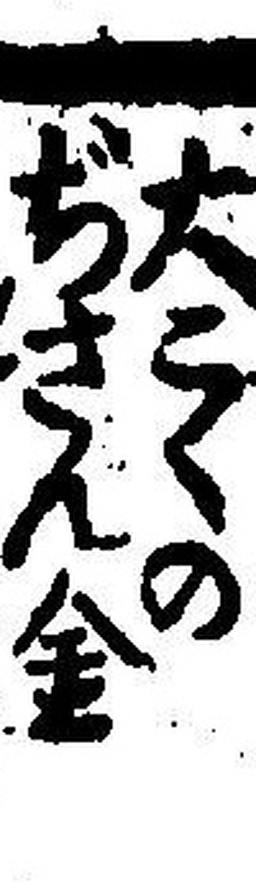ぢさん金
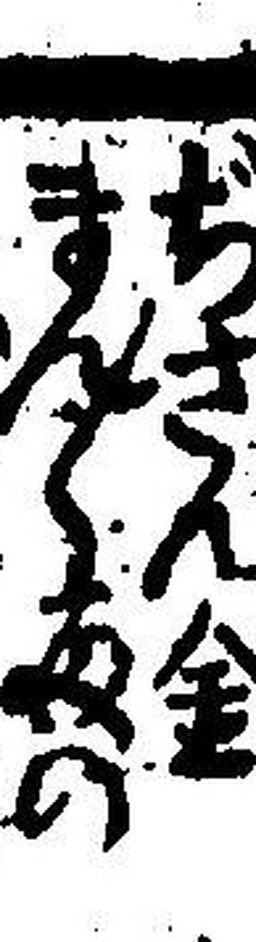まん〳〵両の
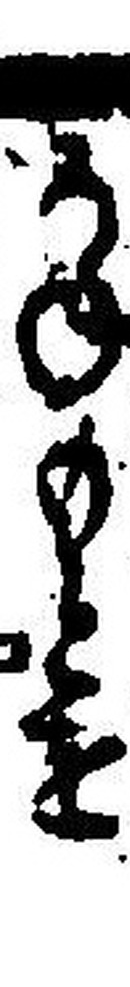かねもとを
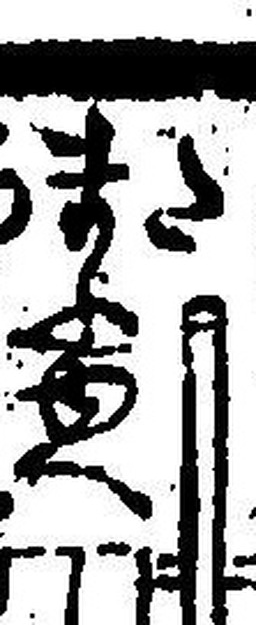まふゆへ
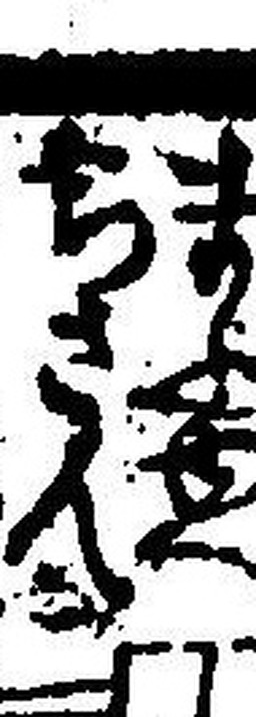ぢさん金
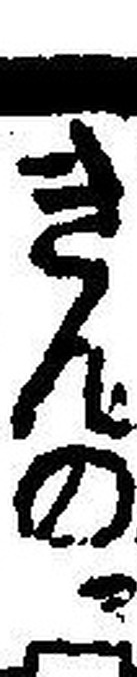きんの
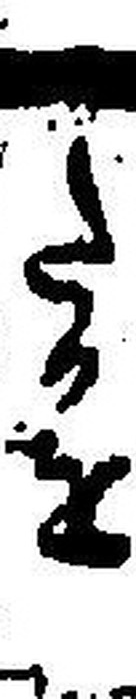たかを
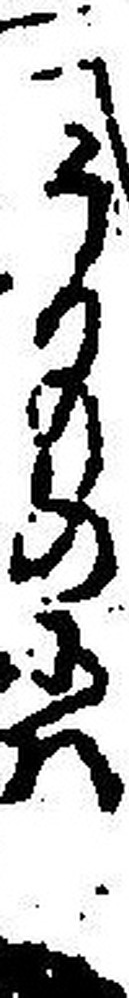〽うりものには
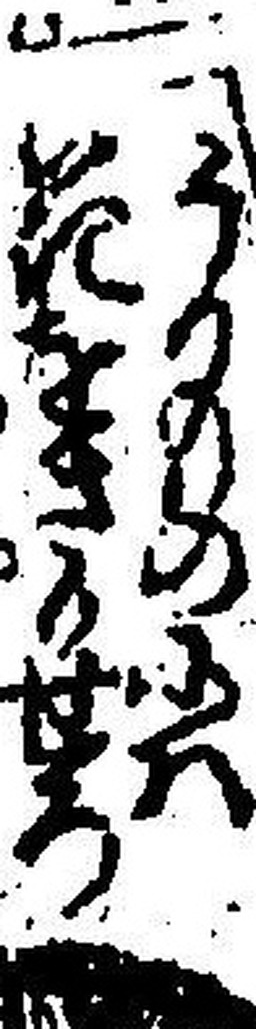花をきかせろ
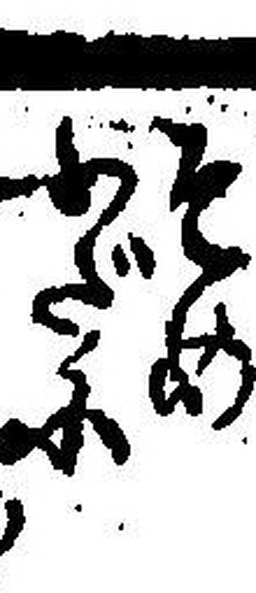ふだに
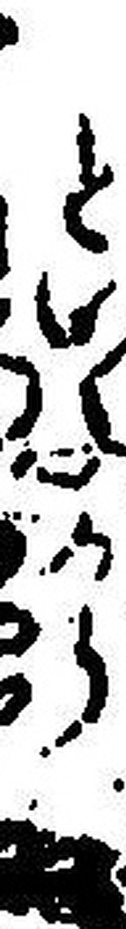といふから
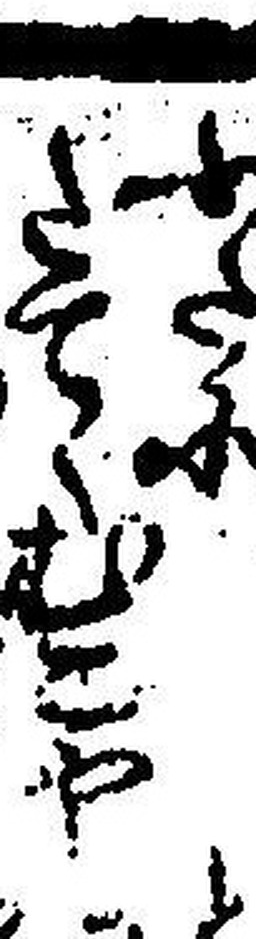たてゝむこや
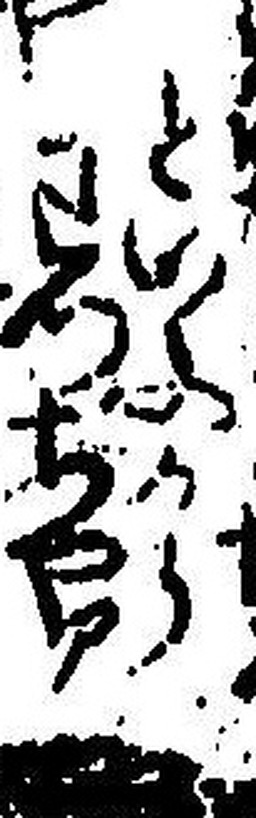わつちやァ
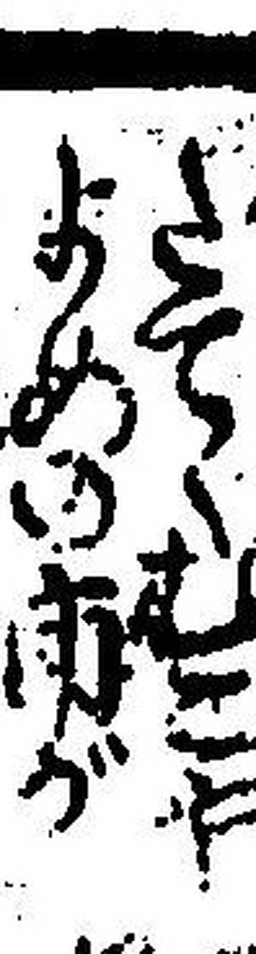よめの市が
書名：徳若水縁起金性 / 樹下石上作
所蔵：東京大学総合図書館 General Library in the University of Tokyo, JAPAN
